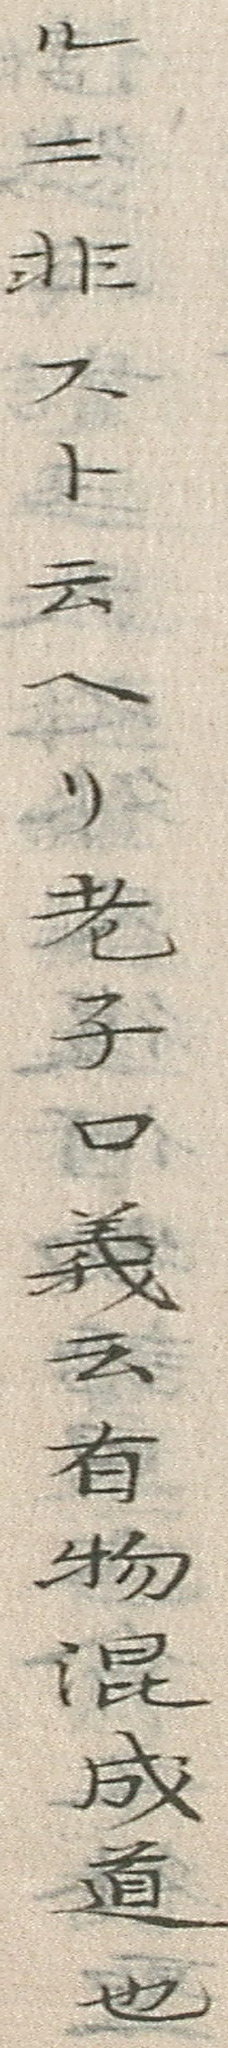ルニ非スト云ヘリ老子口義云有物混成道也
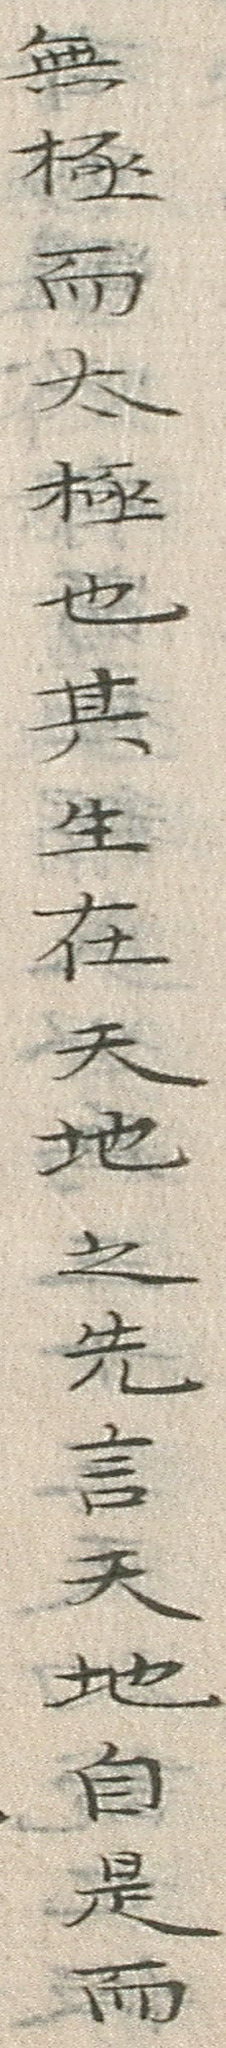無極而太極也其生在天地之先言天地自是而
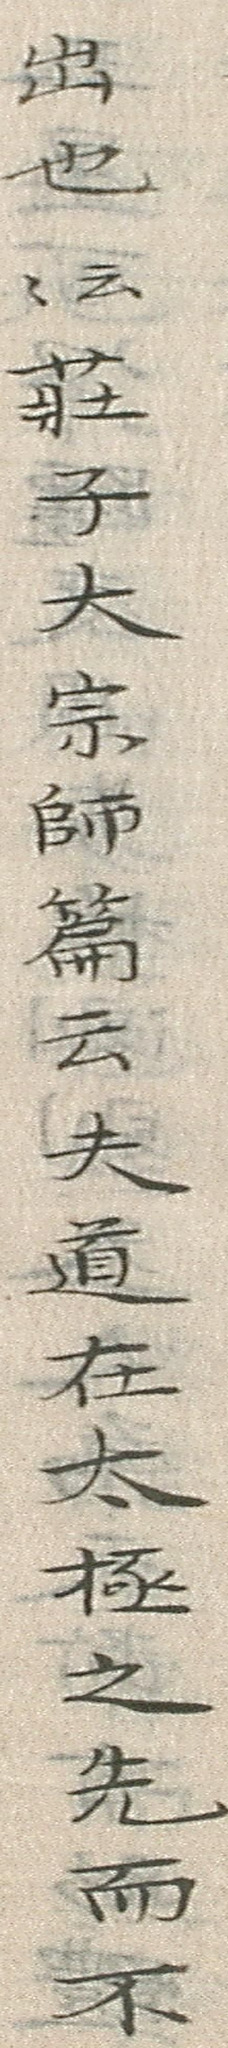出也云〻荘子大宗師篇云夫道在太極之先而不
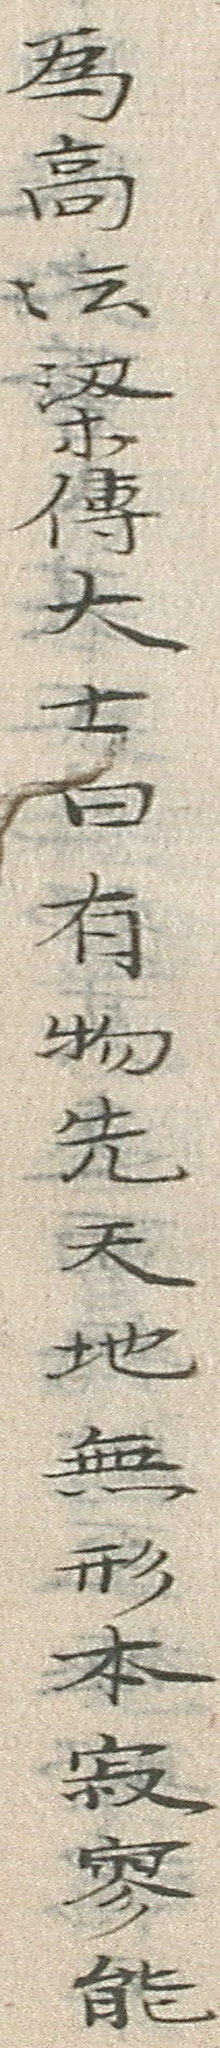為高云〻梁伝大士曰有物先天地無形本寂寥能
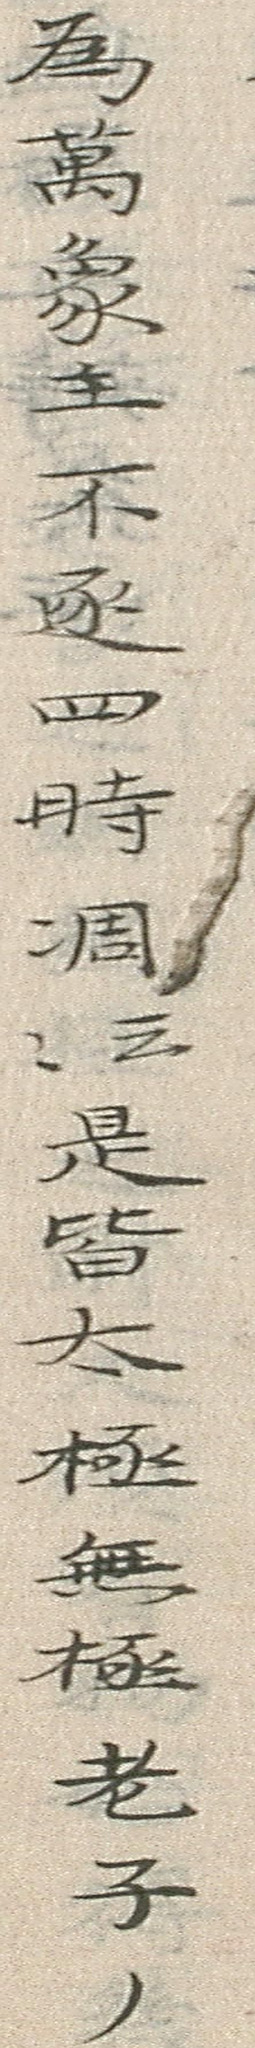為万象主不逐四時凋云〻是皆太極無極老子ノ
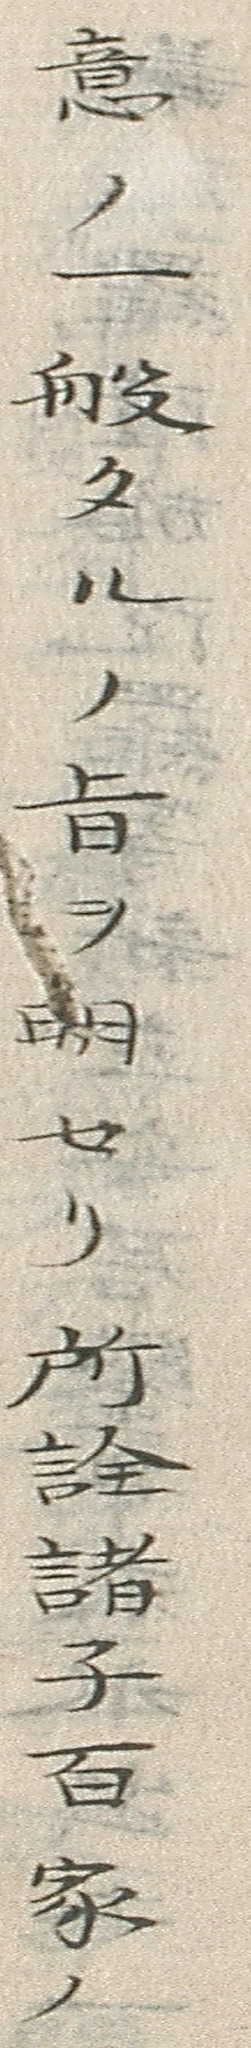意ノ一般タルノ旨ヲ明セリ所詮諸子百家ノ
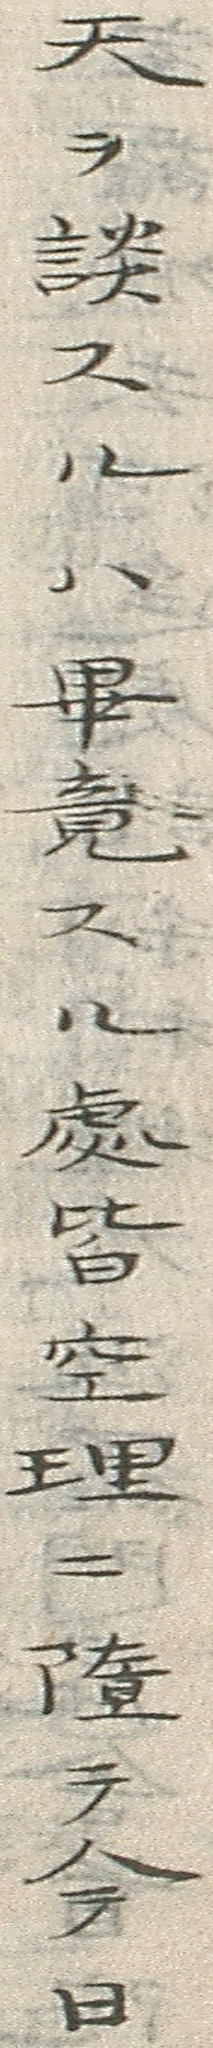天ヲ談スルハ畢竟スル処皆空理ニ墮テ今日
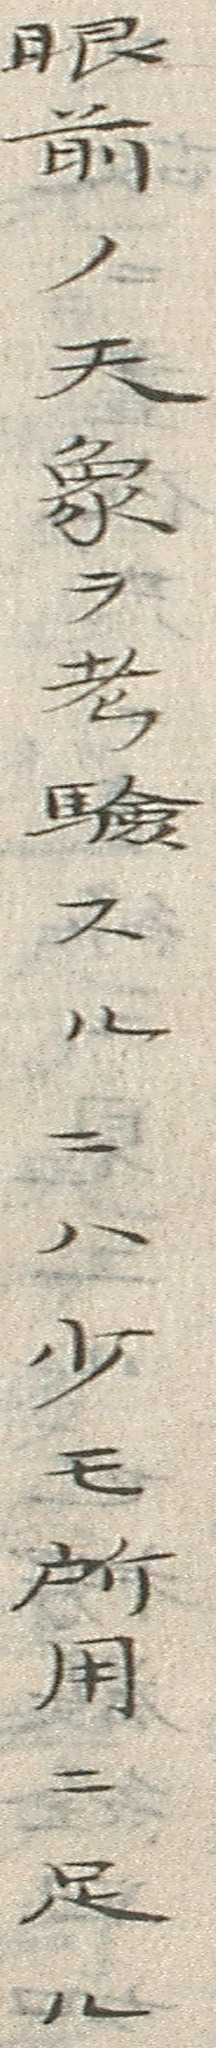眼前ノ天象ヲ考験スルニハ少モ所用ニ足ル
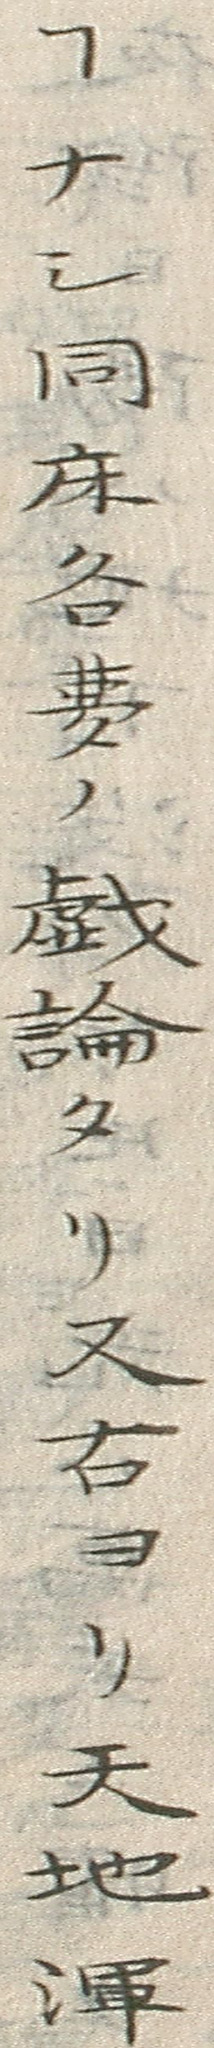コトナシ同床各夢ノ戯論タリ又古ヨリ天地渾
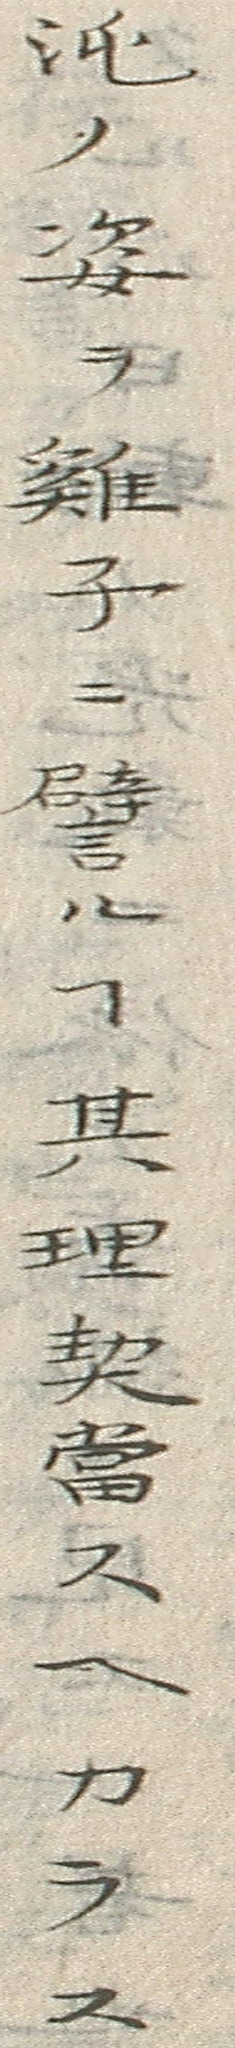沌ノ姿ヲ雞子ニ譬ルコト其理契当スヘカラス
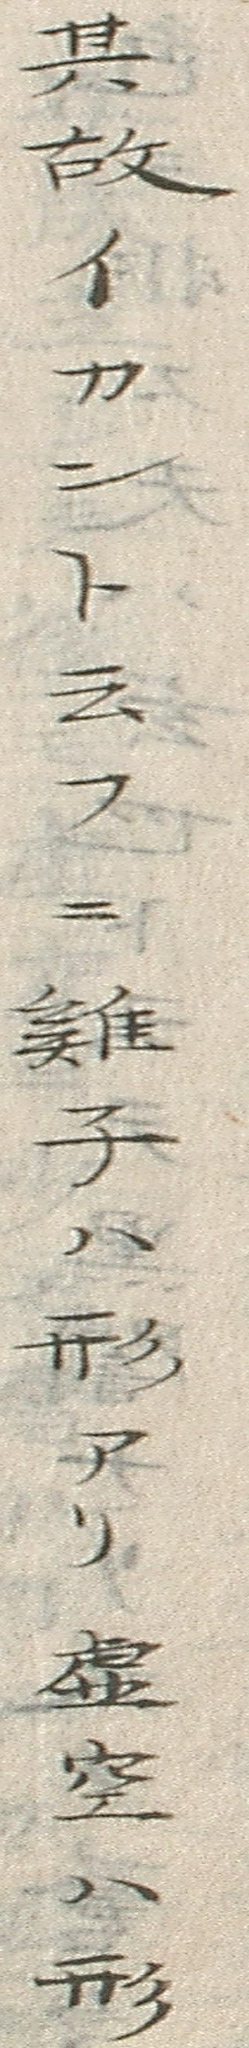其故イカント云フニ雞子ハ形アリ虚空ハ形
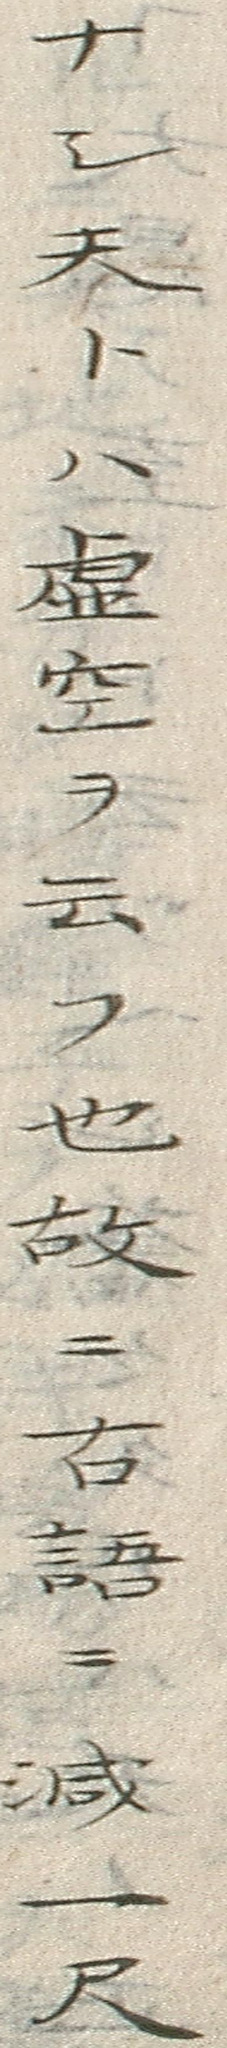ナシ天トハ虚空ヲ云フ也故ニ古語ニ減一尺
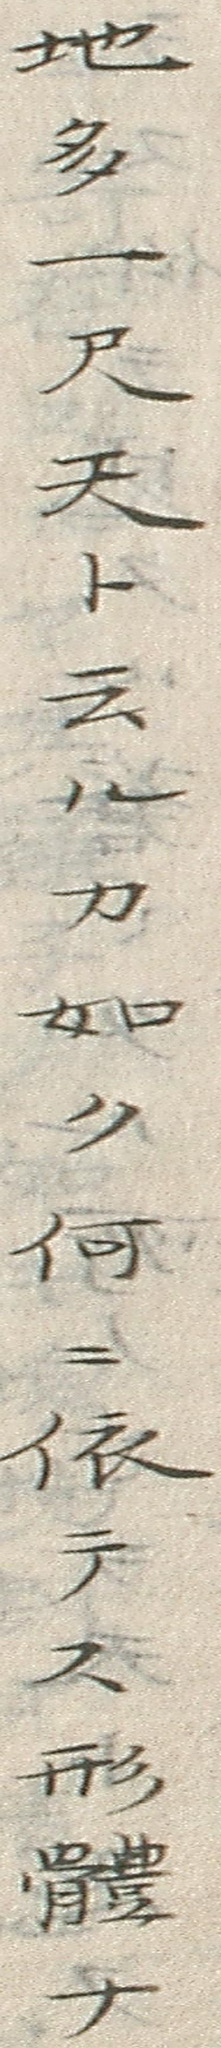地多一尺天ト云ルカ如ク何ニ依テス形体ナ
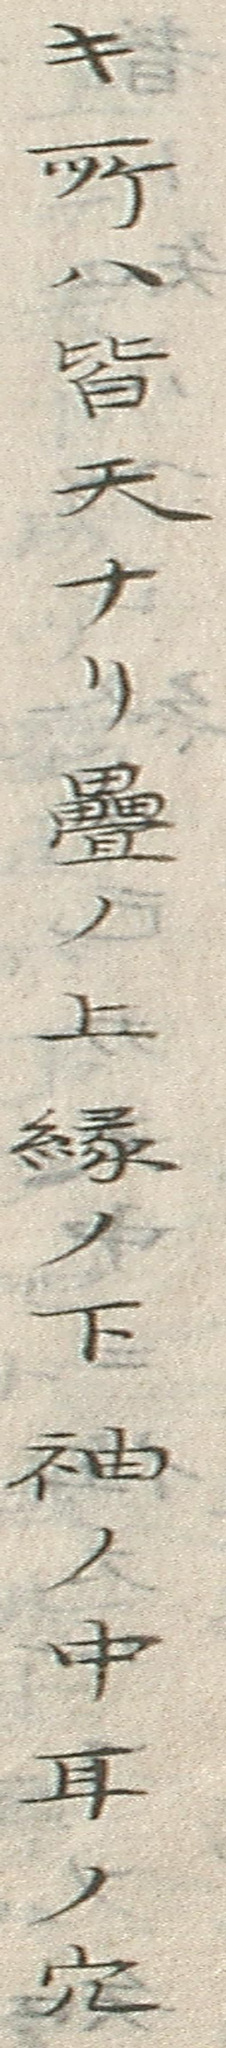キ所ハ皆天ナリ畳ノ上縁ノ下袖ノ中耳ノ穴
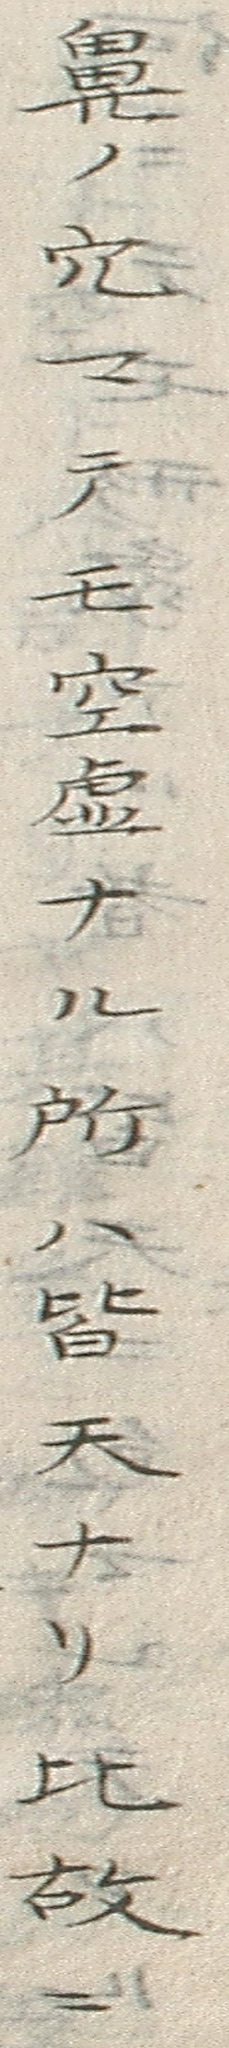鼻ノ穴マテモ空虚ナル所ハ皆天ナリ此故ニ

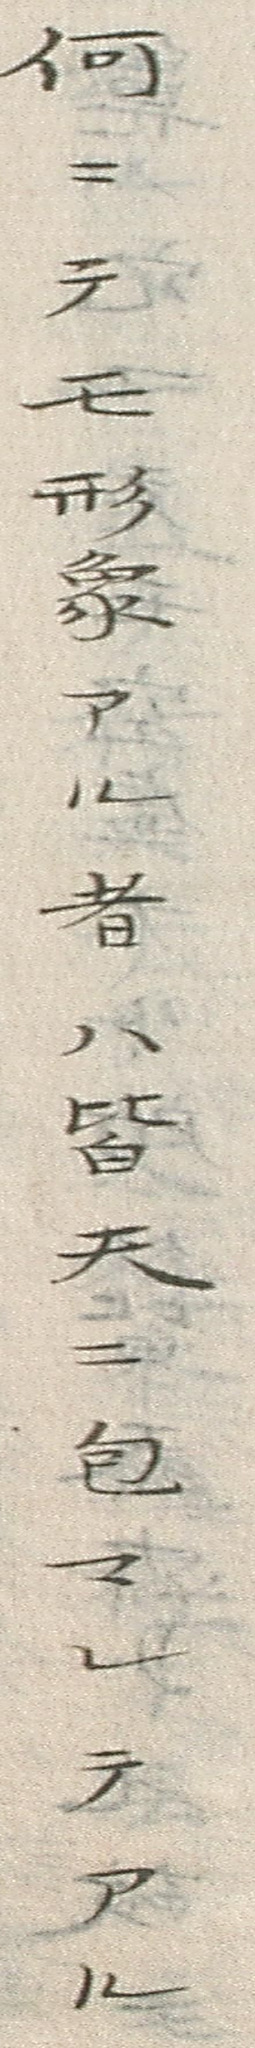何ニテモ形象アル者ハ皆天ニ包マレテアル
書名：天學略名目羽翼　全
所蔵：東京大学地震研究所図書室 Earthquake Research Institute Library, The University of Tokyo, JAPAN
